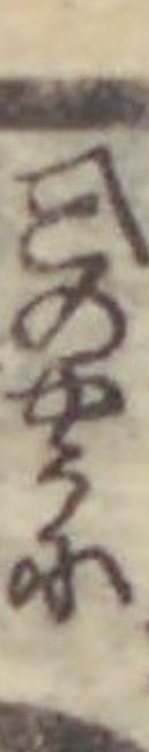〽このやうふ
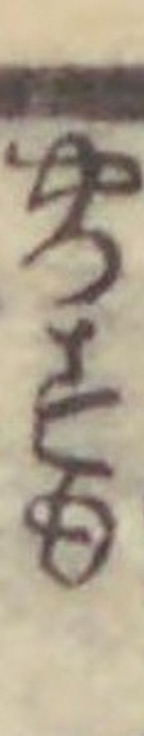やつすも
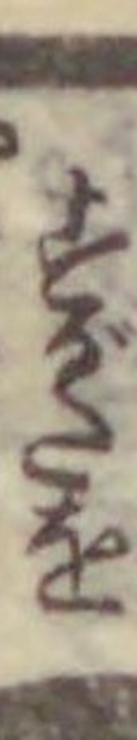すがたを
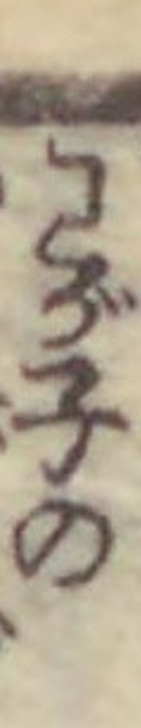わが子の
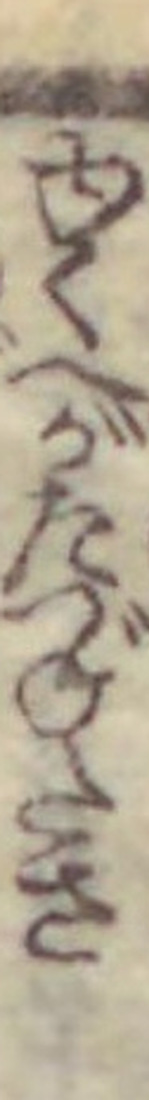ゆくへがたづねたさ
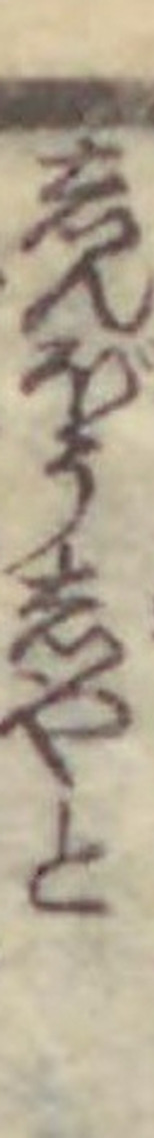しんぼうしやと
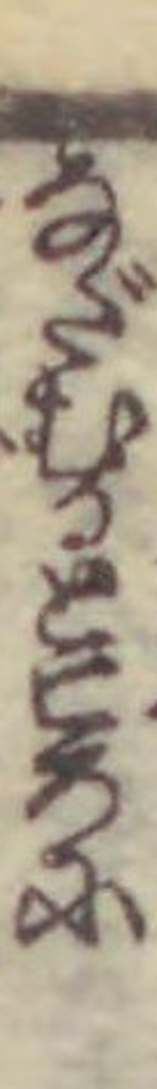なだむるところに
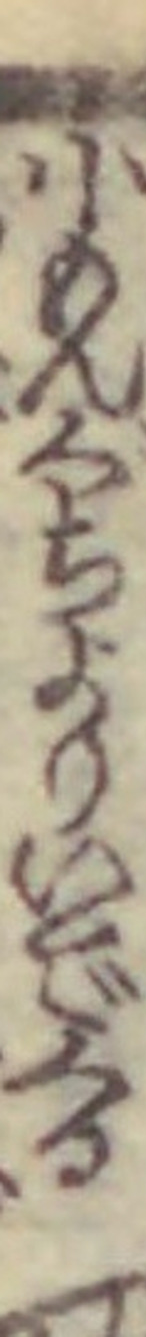小もんぐちよりいでくる
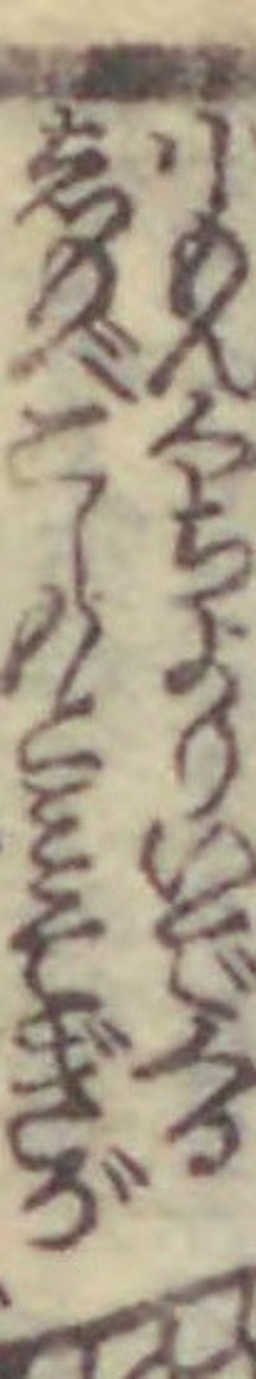しもべこしもとみそぎが
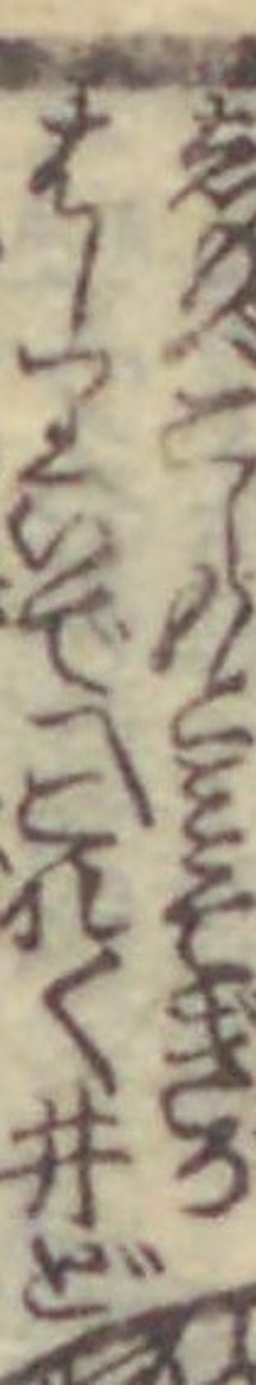はしりいで〽これ〳〵井ど
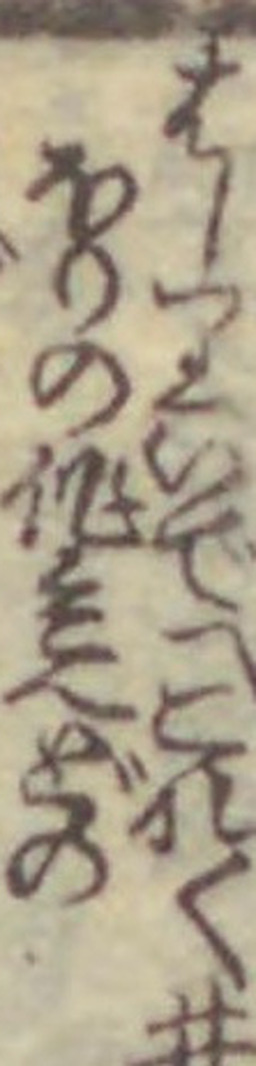ほりの作兵衛どの
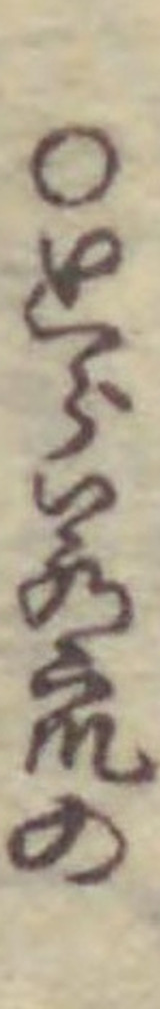○とら若衆の
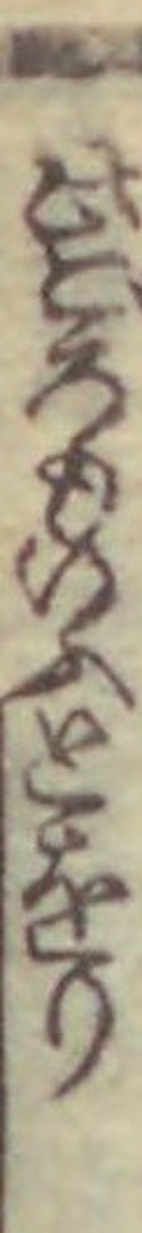此ごろもいふとをり
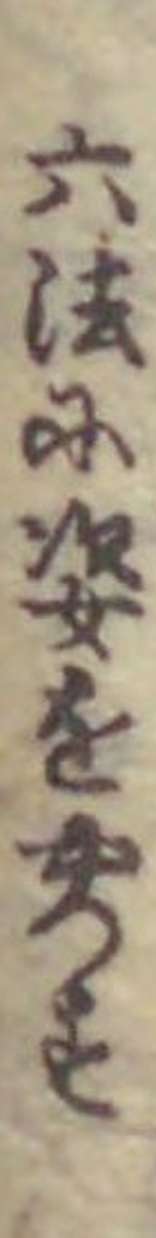六法に姿をやつす
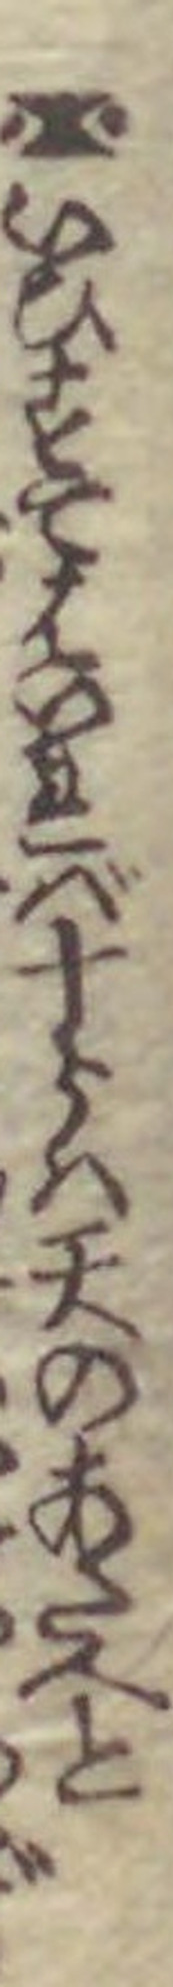▼▲いひすてはいれば十郎は天のあたへと
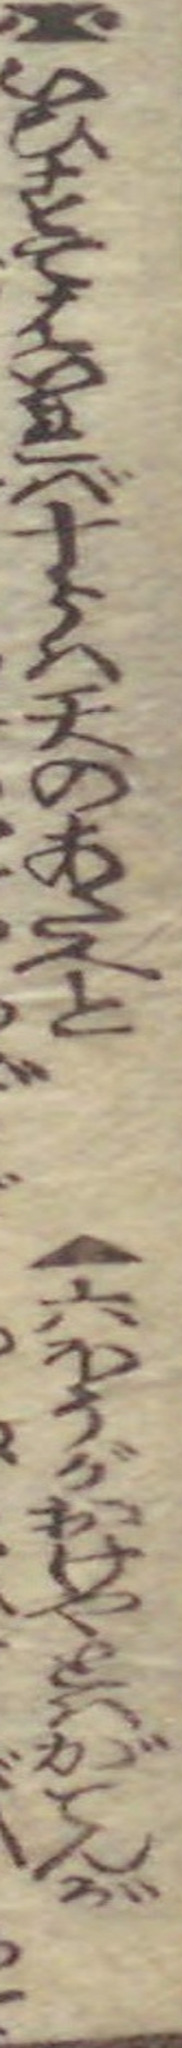▼▲いひすてはいれば十郎は天のあたへと
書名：大時代唐土化物 3巻. 曽我太夫染
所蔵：国立国会図書館 National Diet Library, JAPAN
